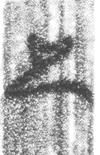也
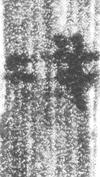弍
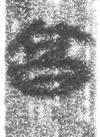合
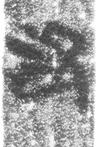忧
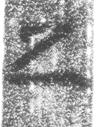也
